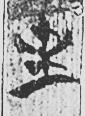生
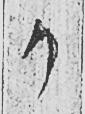人
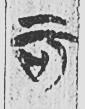可（何）
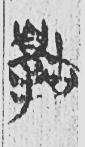{自辛古}
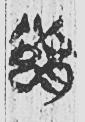豫
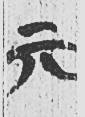亓
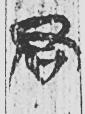君
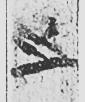之
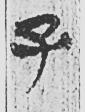子
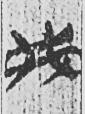弗
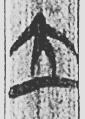立
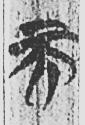而
